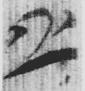之
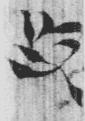及
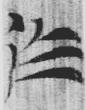於
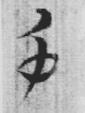身
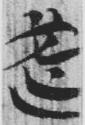武
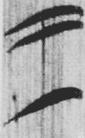王
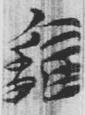○（聞）
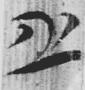之
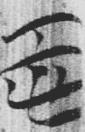{工心}（恐）
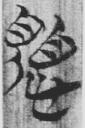{人䀠心}（懼）
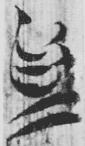爲
